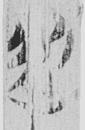從
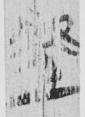○（吾）
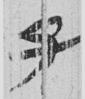子
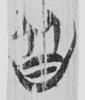皆
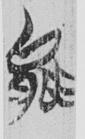能
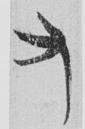又（有）
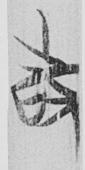○（侍）
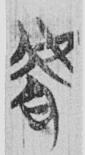○（乎）
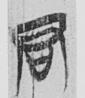君
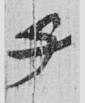子
